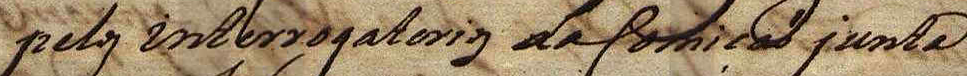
pelos interrogatorios da Comiçaõ junta
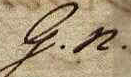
G.n.
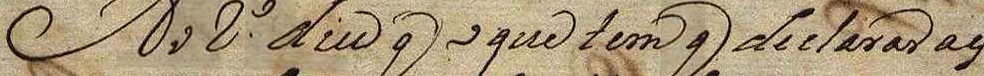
Ao 2.o dice q̄ o que tem q̄ declarar a es
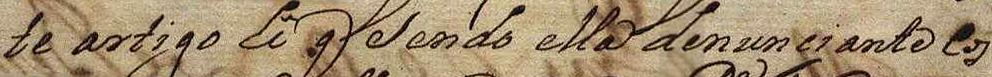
te artigo hê q̄ sendo ella denunciante cos
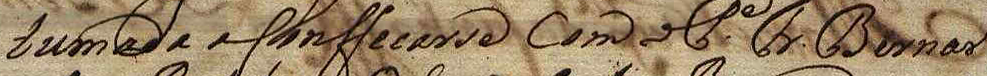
tumada a aConffecarse com o P.e Fr. Bernar
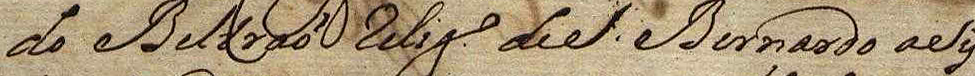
do Beltraõ Relig.o de S. Bernardo aSis
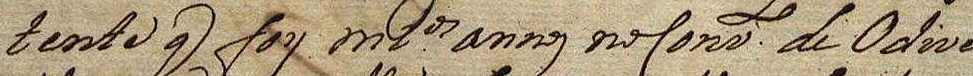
tente q̄ foy mt.os annos no Conv.to de Odive
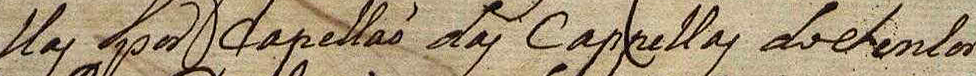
llas por Capellaõ das Cappellas do Senhor
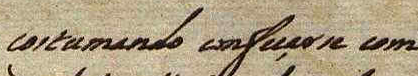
costumando confeçarse com
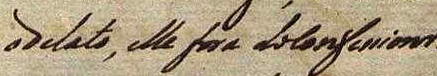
o delato, elle fora do confessionr.o
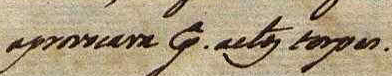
a provocara p.a actos torpes.
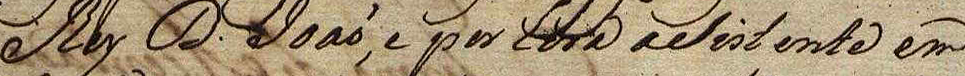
Rey D. Ioaõ, e por hora aSistente em
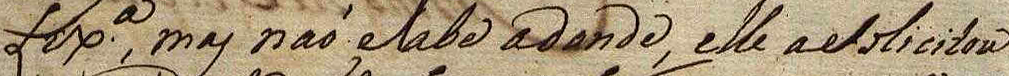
Lix.a., mas naõ sabe adonde, elle a Solicitou
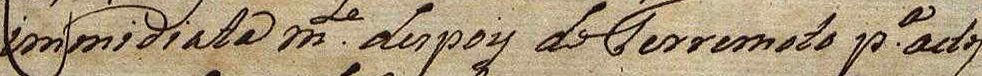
immidiatam.te despois do Terremoto p.a actos
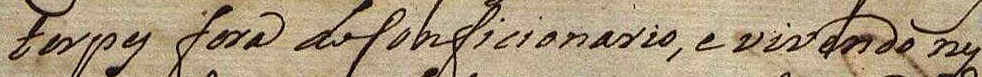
torpes fora do Conficionario, e vivendo nes
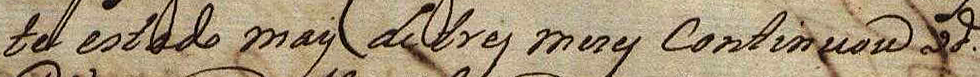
te estado mais de tres mezes continuou o d.o
